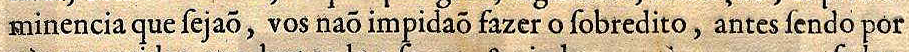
minencia que sejaõ, vos naõ impidaõ fazer o sobredito, antes sendo por
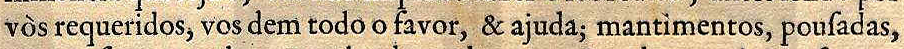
vòs requeridos, vos dem todo o favor, & ajuda; mantimentos, pousadas,
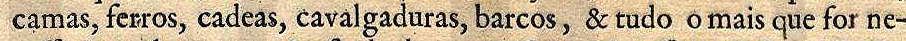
camas, ferros, cadeas, cavalgaduras, barcos, & tudo o mais que for ne
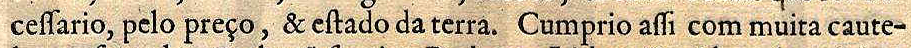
cessario, pelo preço, & estado da terra. Cumprio assi com muita caute
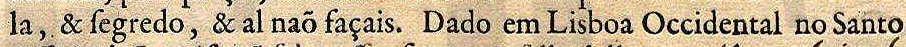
la, & segredo, & al naõ façais. Dado em Lisboa Occidental no Santo
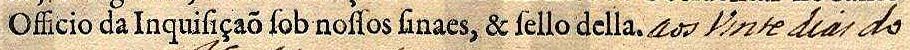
Officio da Inquisiçaõ sob nossos sinaes, & sello della aos Vinte dias do
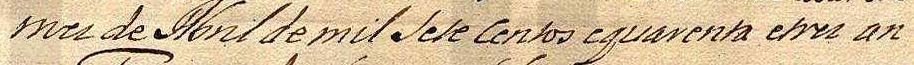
mes de Abril de mil setecentos e quarenta e trez an
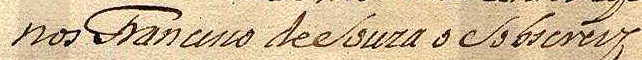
nos Francisco de Souza o Sobscrevy
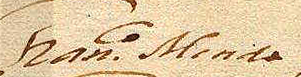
Fran.co Mendo
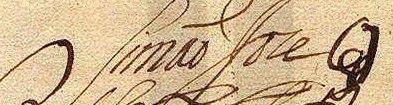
Simaõ Joze
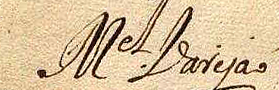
Mel. Varejaõ
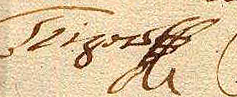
Trigozo
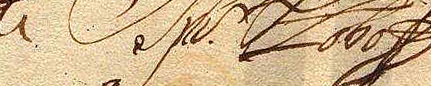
Sylv.ra Lobo
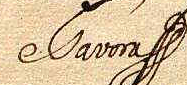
e Tavora
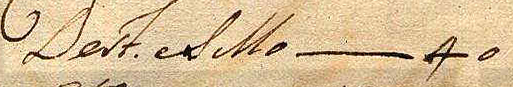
Dert. e Sello - 40
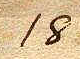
18
